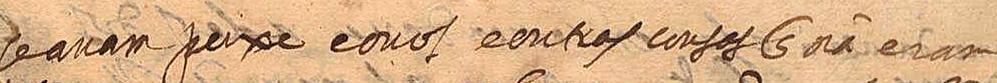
ceavam peixe e ovos e outras cousas q̄ nā eram
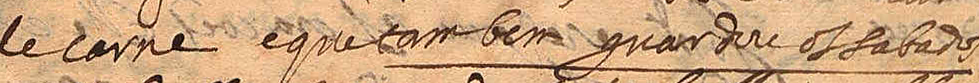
de carne e que também guardou os sabados
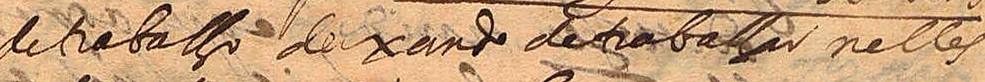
de trabalho deixando de trabalhar nelles
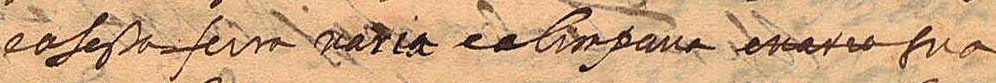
e a sesta feira varia e alimpava _ sua
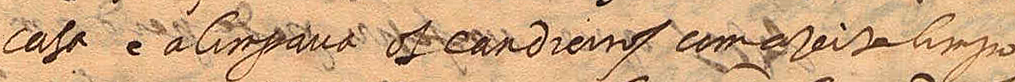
casa e alimpava os candeeiros com azeite limpo
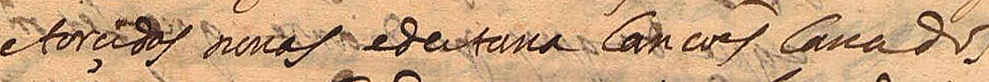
e torçidas novas e deitava lancoes̄ lavados
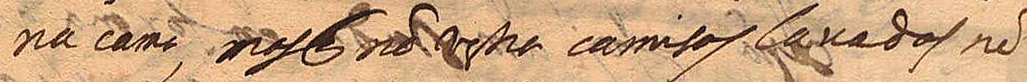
na cama, mas q̄ nā vstia camisas lavadas nē
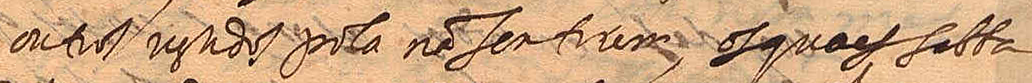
outros vestidos pola nā sentirem, os quaes sabba
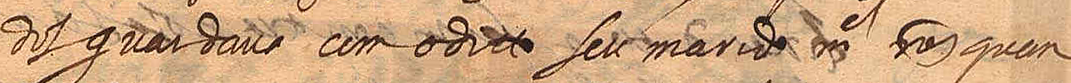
dos guardava com o dito seu marido mel vāz quan
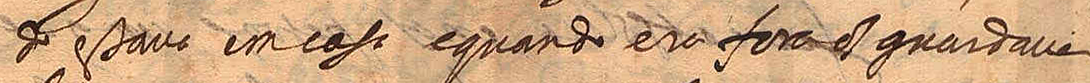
do estava em casa e quando era fora os guardava
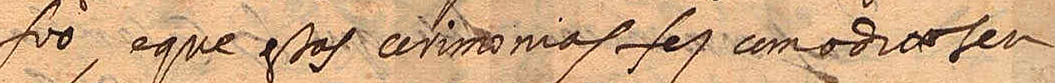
soo, e que estas cerimonias fez com o dito seu
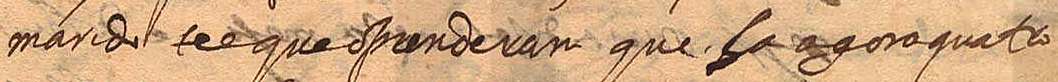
marido tee que o prenderam que ha agora quatro
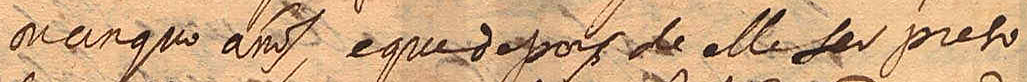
ou cinquo an̄os, e que depois de elle ser preso
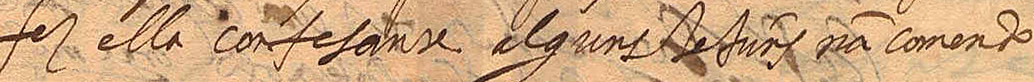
fez ella confesante alguns jejun̄s nā comendo
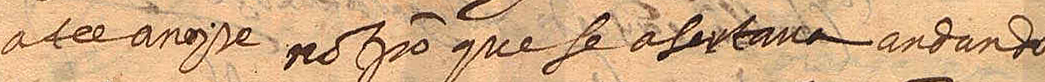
atee a noyte no tpō que se asertava andando
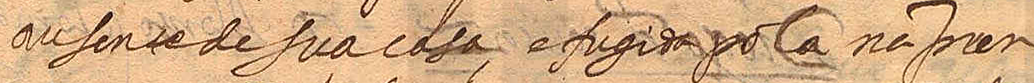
ausente de sua casa, e fugida pola nā pren
